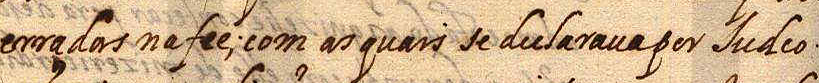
erradas na feé; com as quais se declaraua por Iudeo
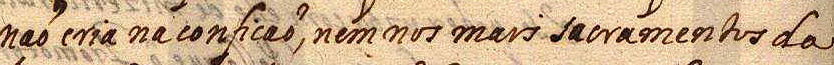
naõ cria na confiçaõ, nem nos mais sacramentos da
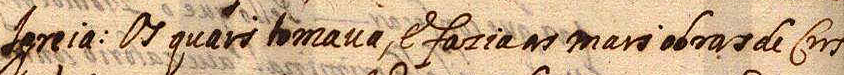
Igreia: Os quais tomaua, e fazia as mais obras de Cris
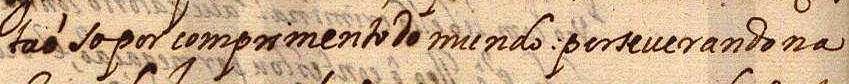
taõ so por comprimento do mundo: perseuerando na
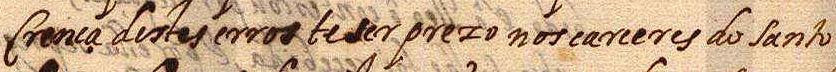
Crença destes erros te ser prezo nos carceres do santo
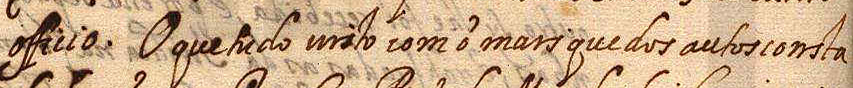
officio. O que tudo uisto com o mais que dos autos consta
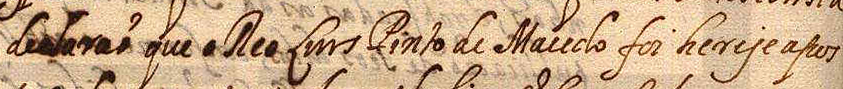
declaraõ que o Reo Luis Pinto de Macedo foi hereje apos
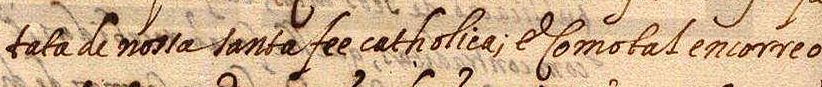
tata de nossa santa fee catholica; e Como tal encorreo
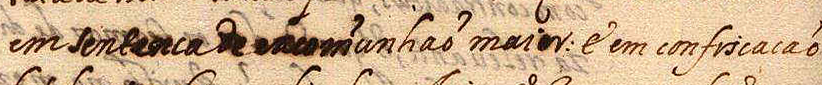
em sentença de excom̄unhaõ maior: e em confiscaçaõ
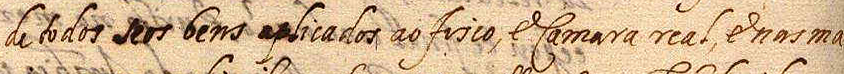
de todos seos bens aplicados ao fisco, e Camara real, e nas ma
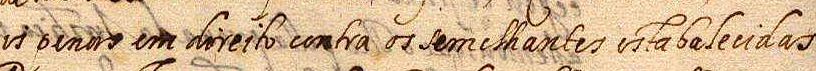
is penas em direito contra os semelhantes estabalecidas
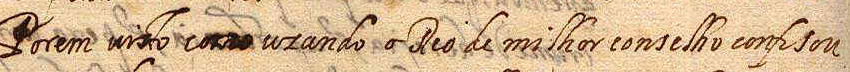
Porem uisto como uzando o Reo de milhor conselho confesou
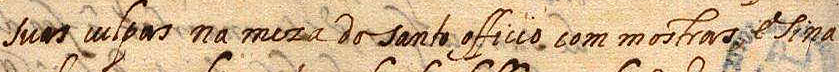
suas culpas na meza do santo officio com mostras, e sina
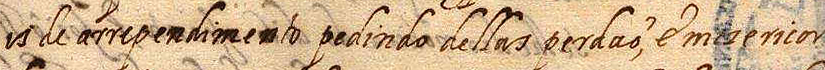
is de arrependimento pedindo dellas perdaõ, e mizericor
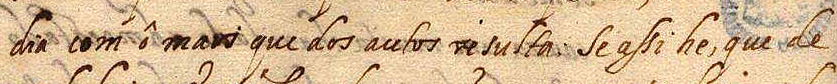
dia com o mais que dos autos resulta: se assi he, que de
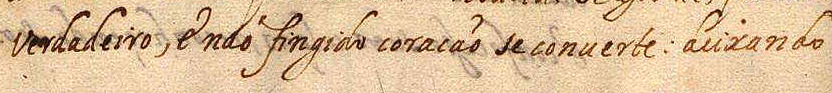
verdadeiro, e naõ fingido coraçaõ se conuerte: deixando
